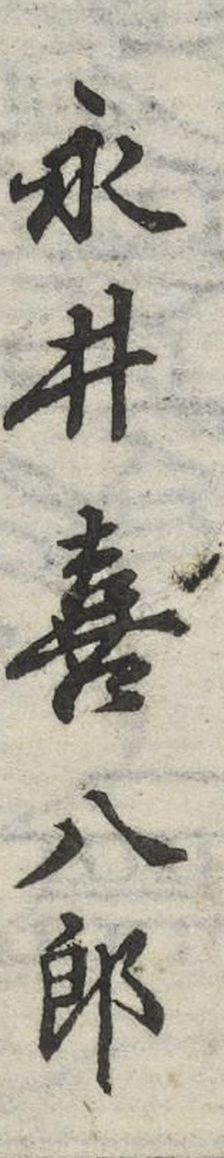永井喜八郎
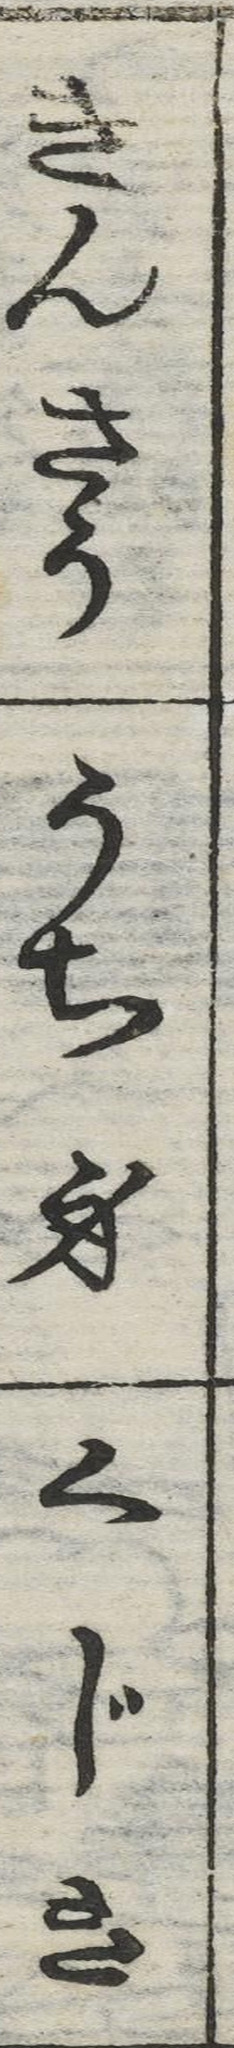きんさううち身くじき
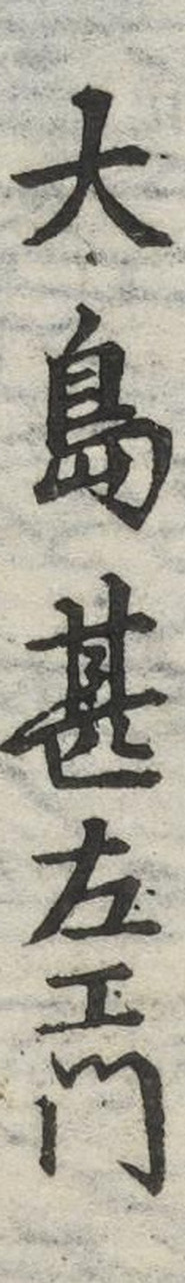大島甚左エ門
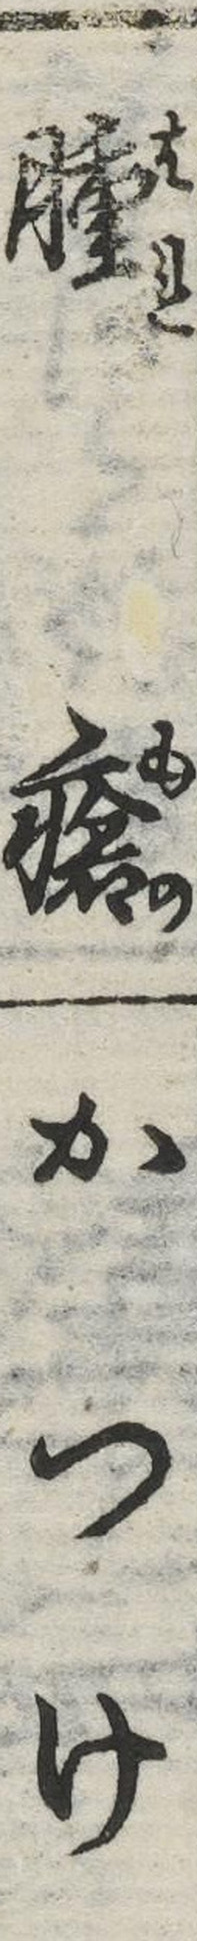腫瘡かつけ
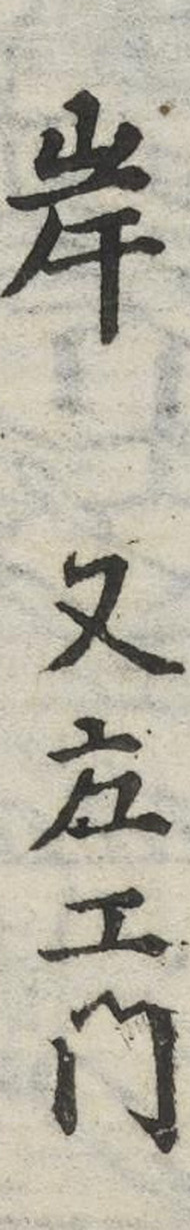岸又左エ門
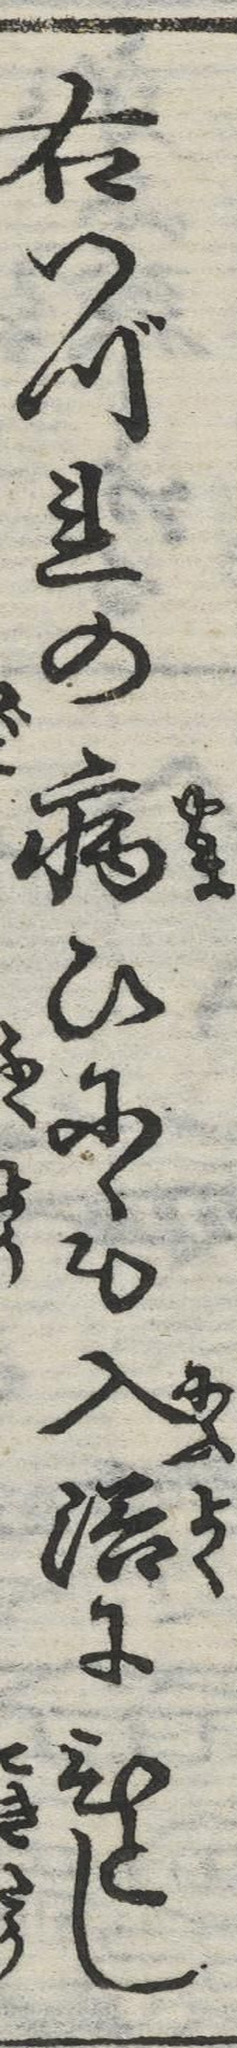右いづれの病ひにも入浴にひとし
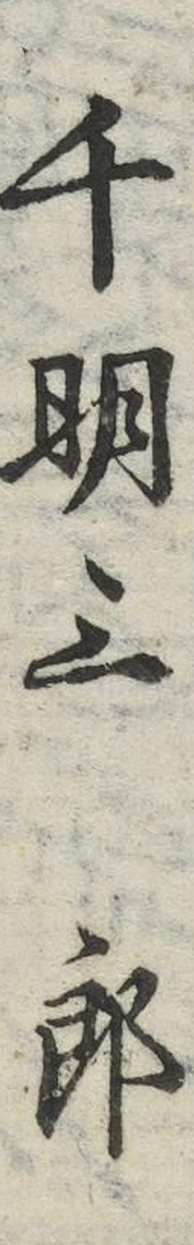千明三郎
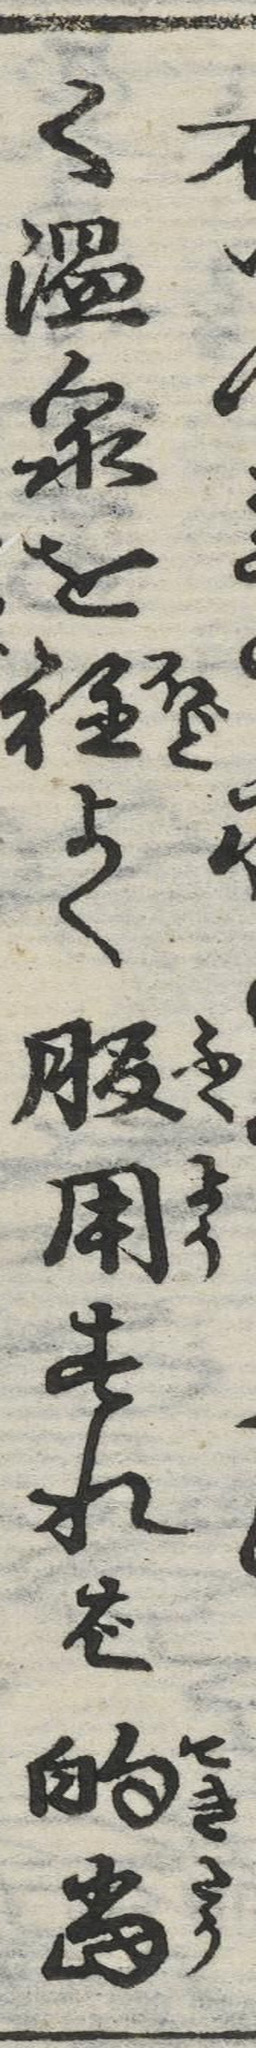く温泉を程よく服用すれば的当
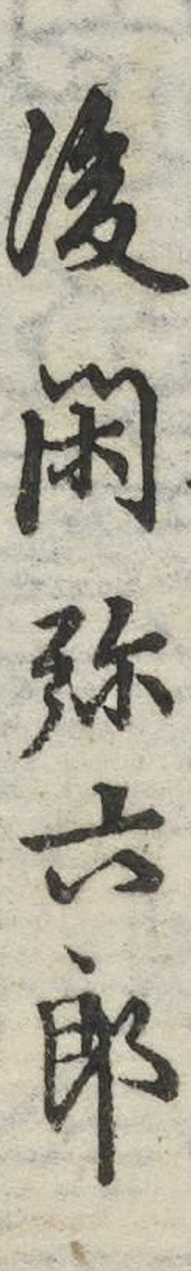後閑弥六郎
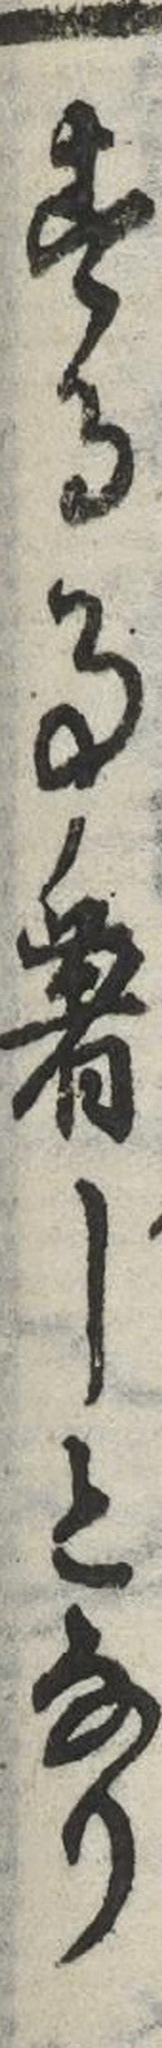する事の著しとなり
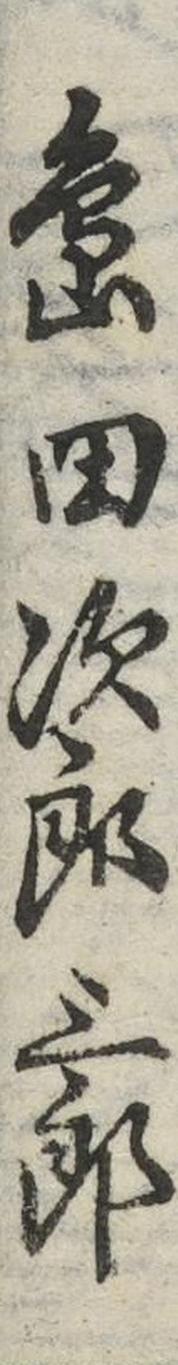島田次郎三郎
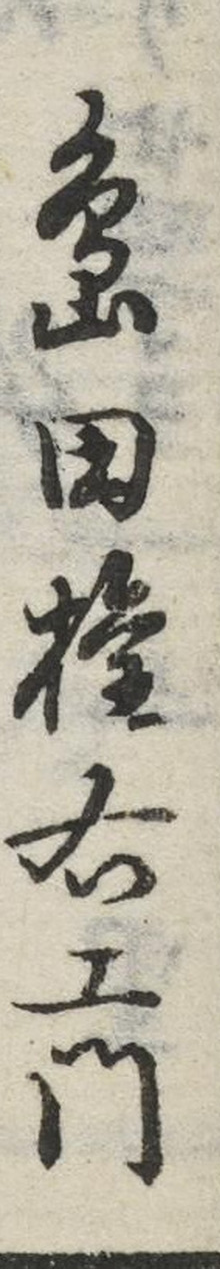島田権右エ門
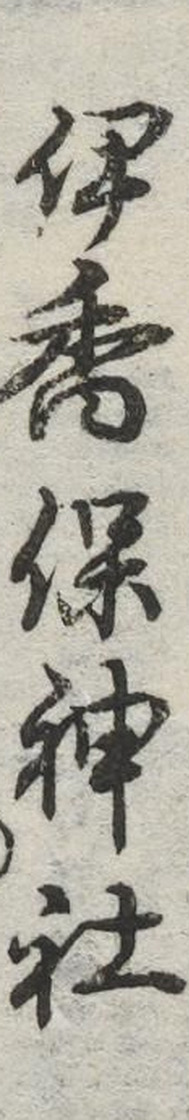伊香保神社
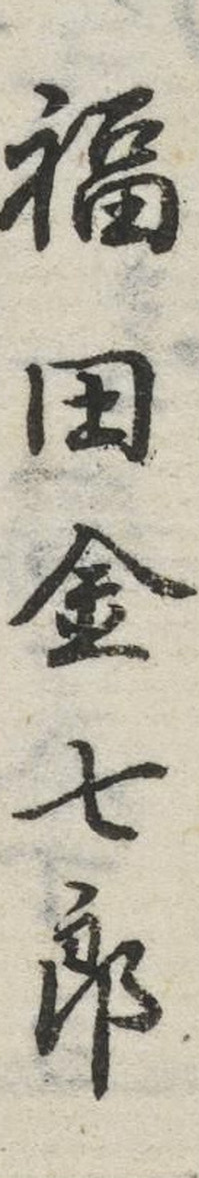福田金七郎
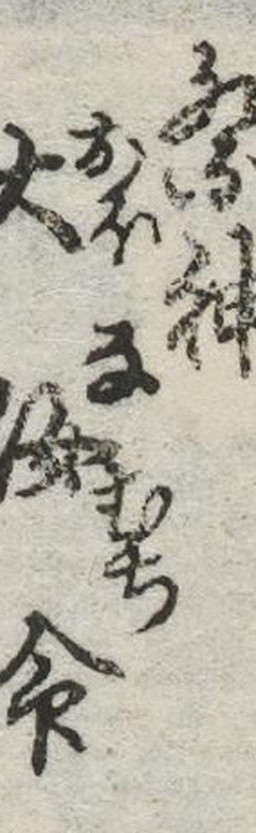大汝命
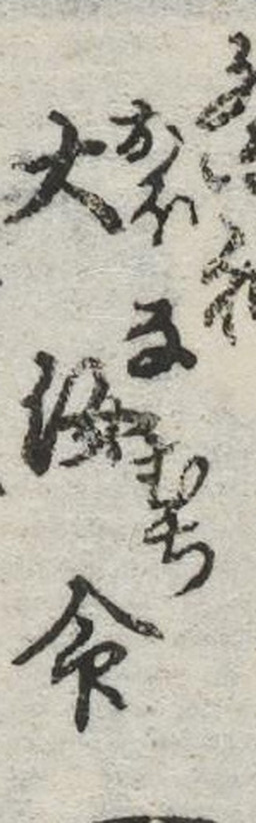大汝命
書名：諸國温泉遊覽記　全
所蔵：東京大学地震研究所図書室 Earthquake Research Institute Library, The University of Tokyo, JAPAN
